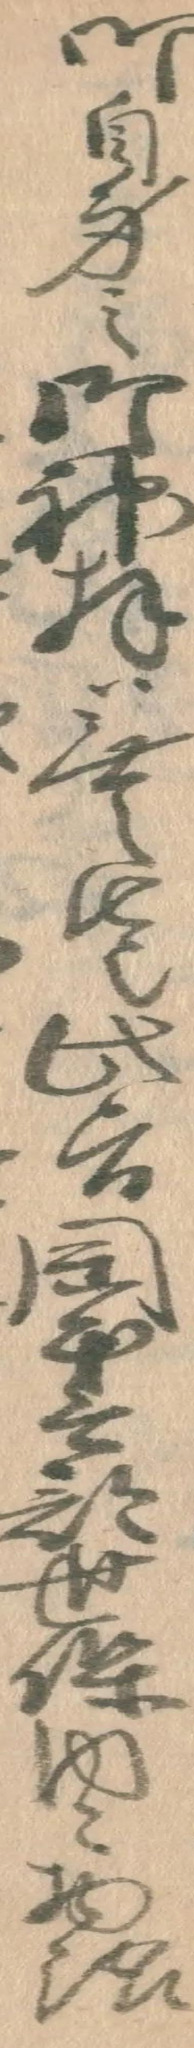御自身之御神拝ハ無之由也此旨岡本兵部世保内々物語
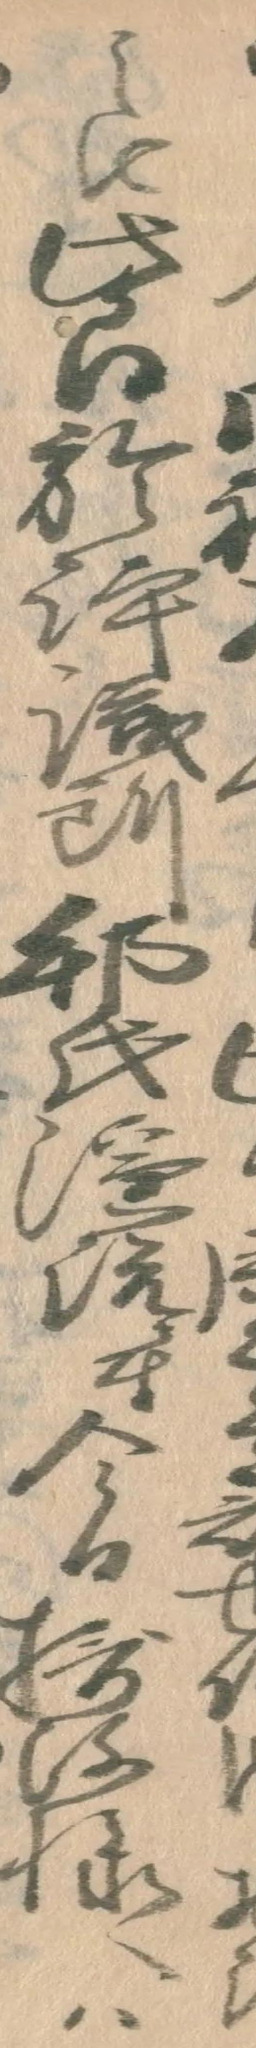之由此間於評議所邦氏演説ニ付今日摂政様へハ
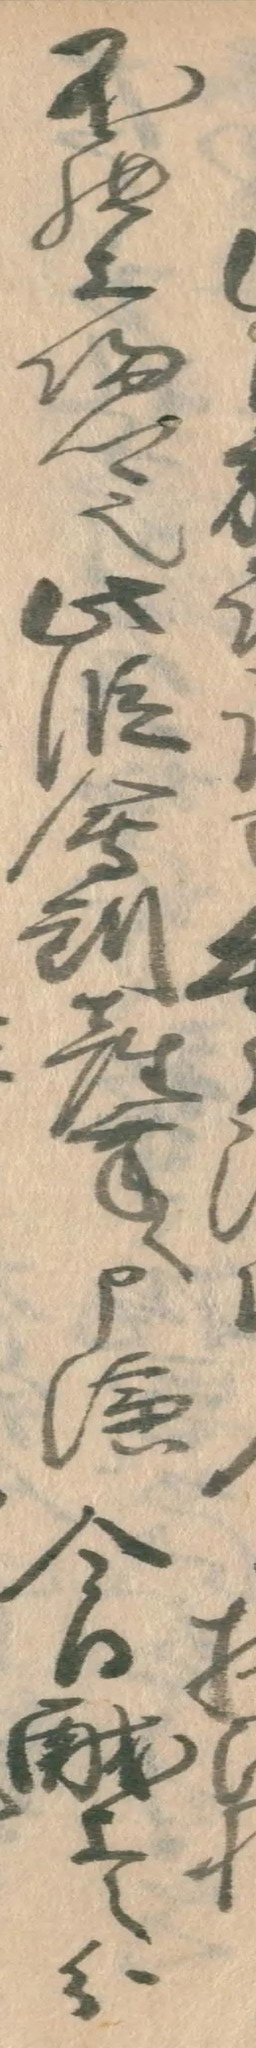不罷上帰郷也此段会所産幸へ申演今日献上之分
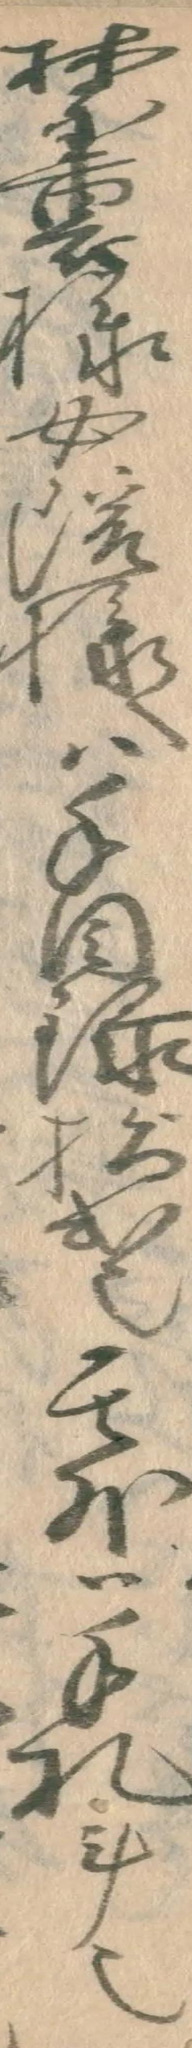禁裏様女院様へハ手目録指出也其外ハ手札計也
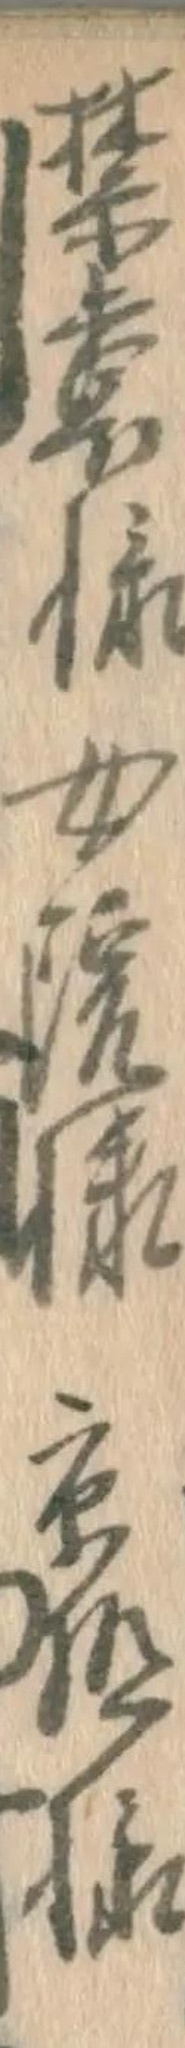禁裏様女院様京極様
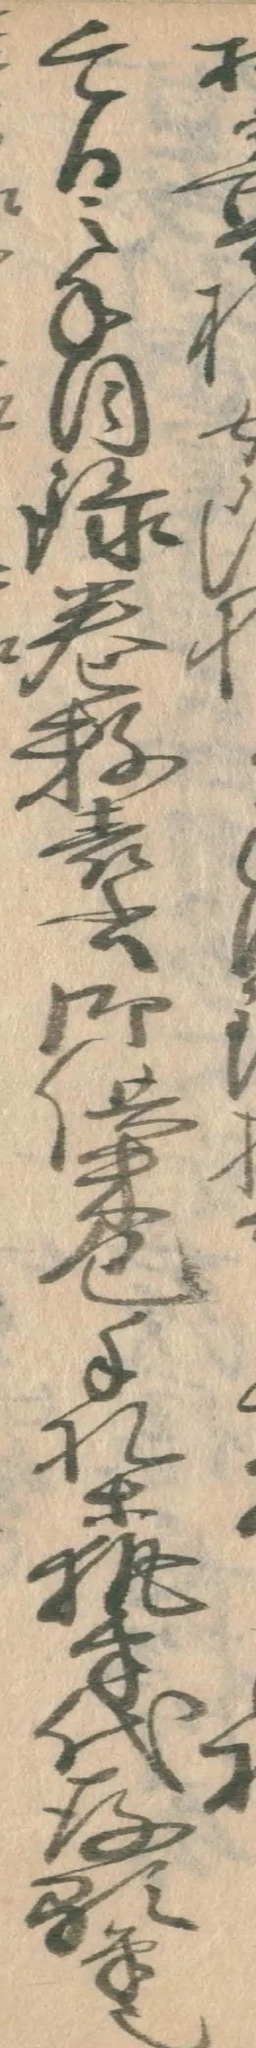今日之手目録巻数表書御供米包手札等執筆代存顕筆也
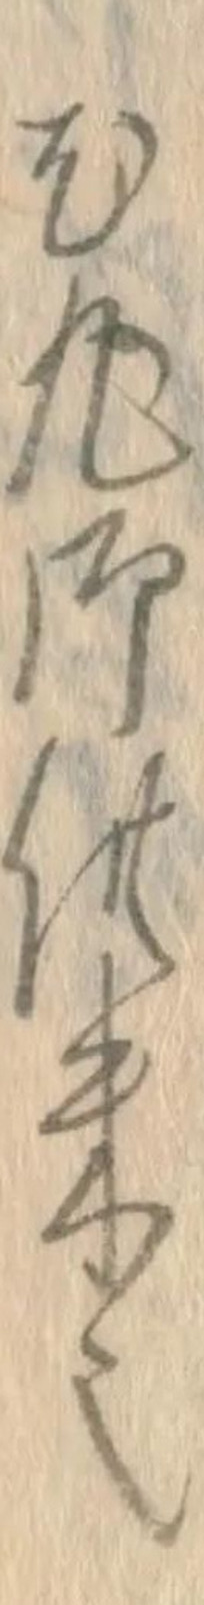尤丸御供米也

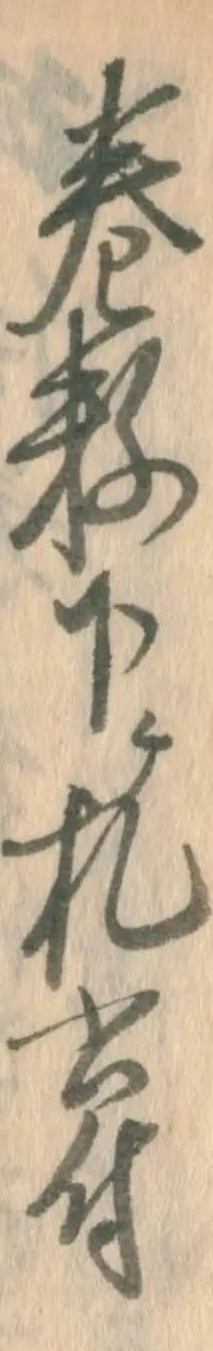巻数下ケ札書付
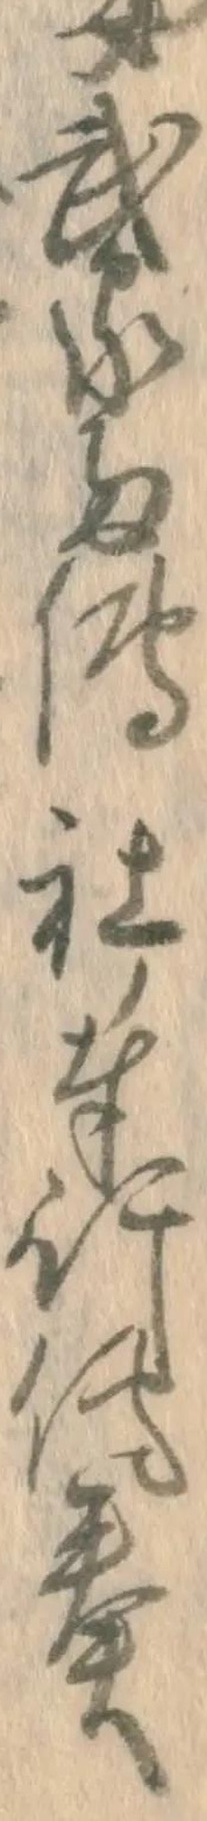武家両伝社ノ奉行伝奏
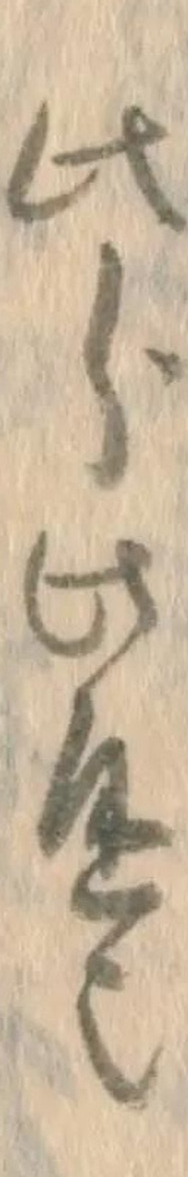此分此通也
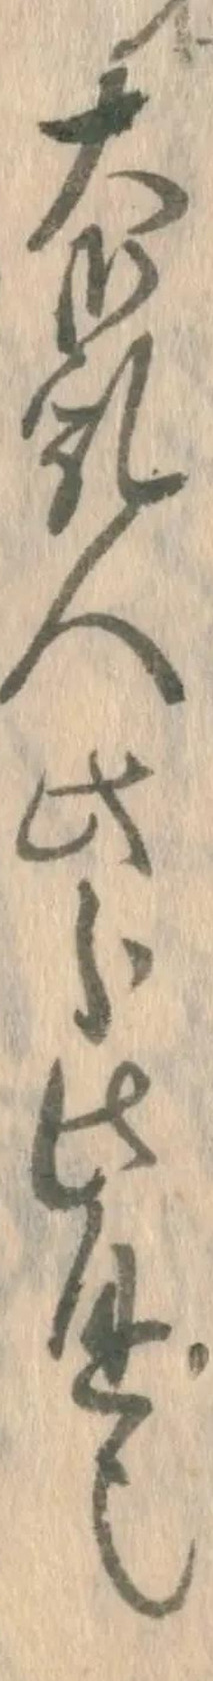大御乳人此分此通也
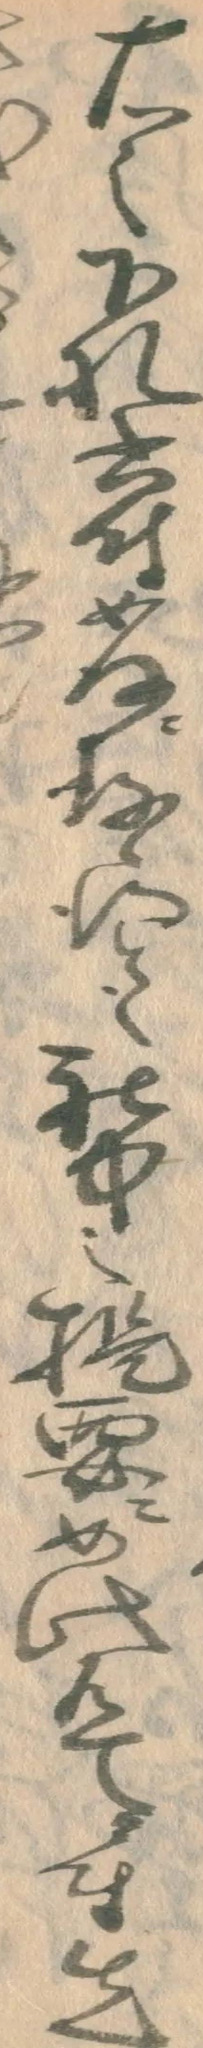右之下札書付如何ニ存候得とも社中之提要ニ如此有之ニ付先
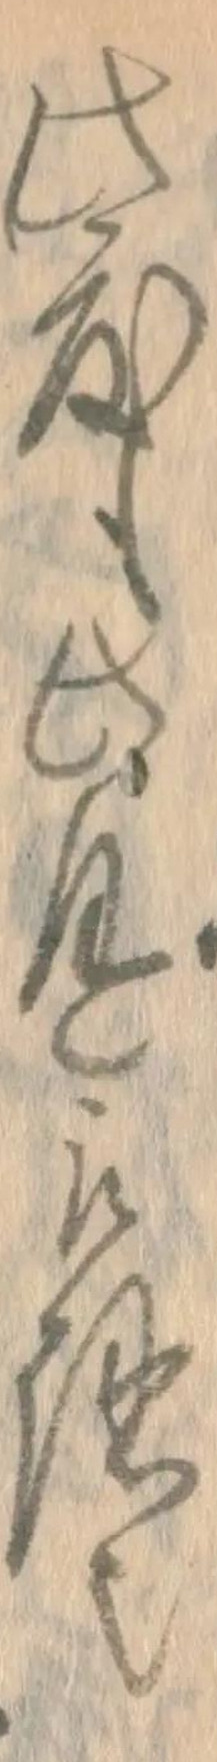此度も此通被認也
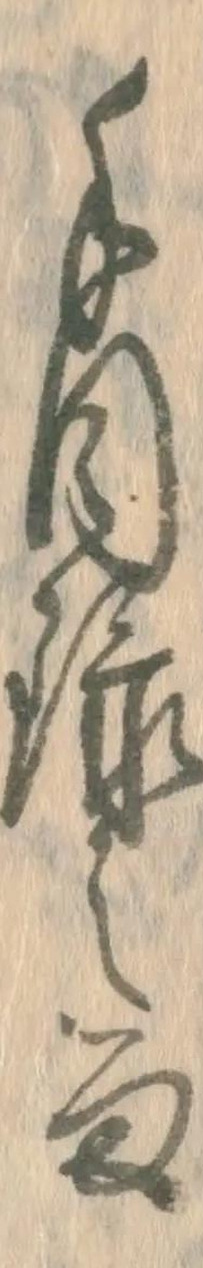手目録之留
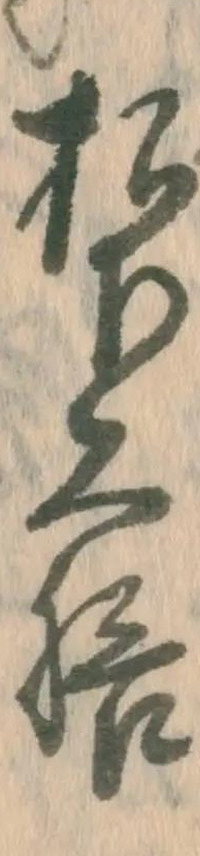松下大膳
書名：賀茂社記録. 第60冊
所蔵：国立国会図書館 National Diet Library, JAPAN
